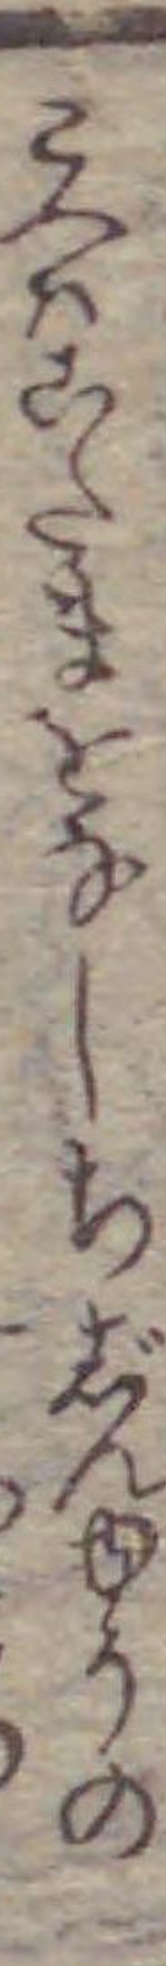こへはこたまをなしちじんゆうの
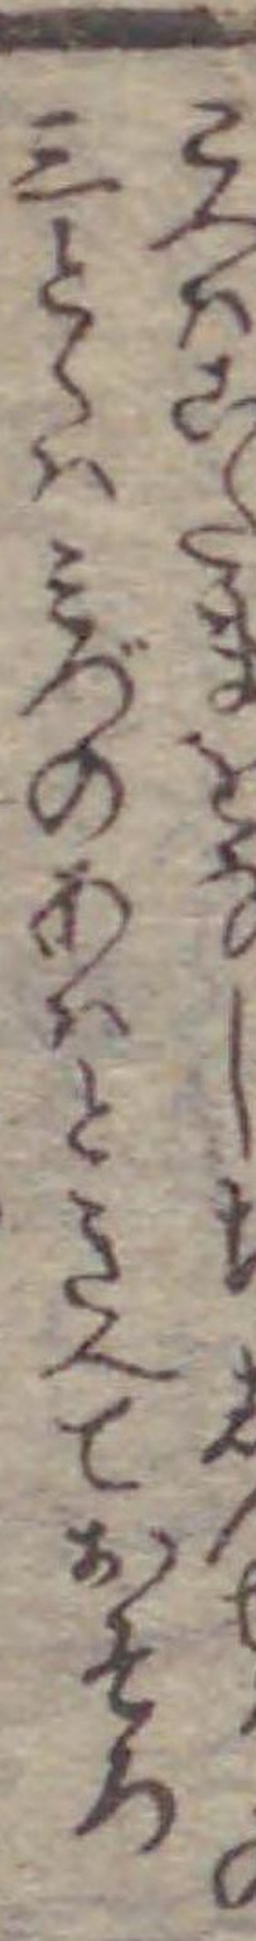三とくはみづのあはときへておそろ
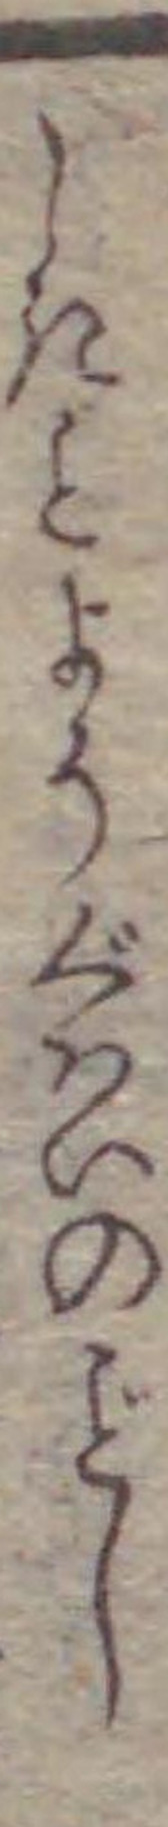しきことようぐはいのごとし
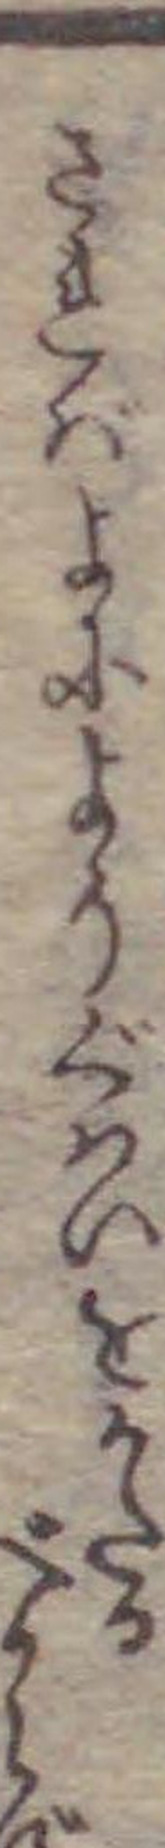さればよにようぐはいをかたる

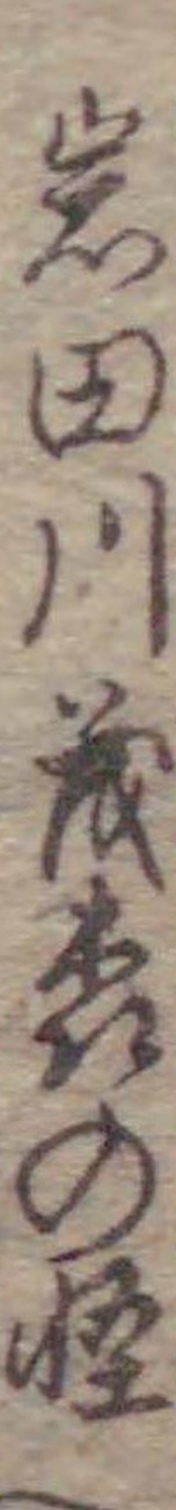岩田川茂森の怪
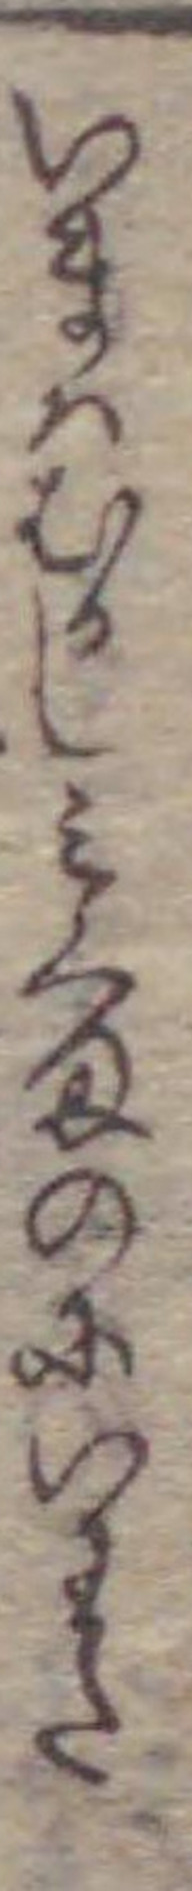いまはむかしみくまのにいわた
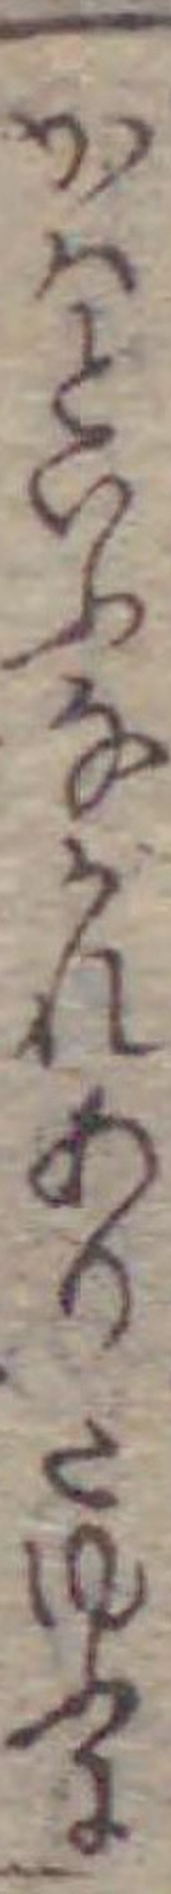かはといふなかれありさゆふに
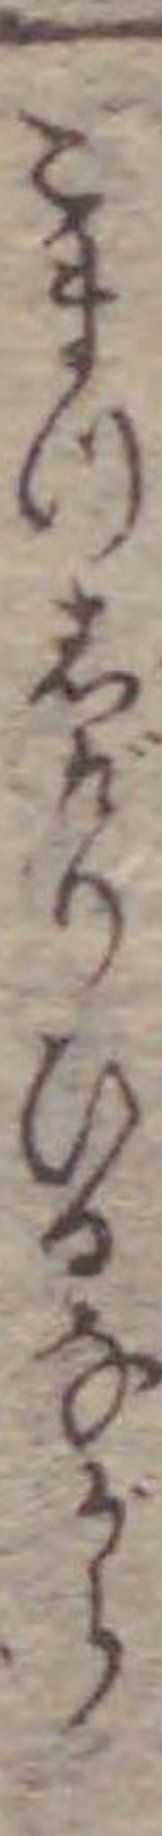こまつしげりひるながら
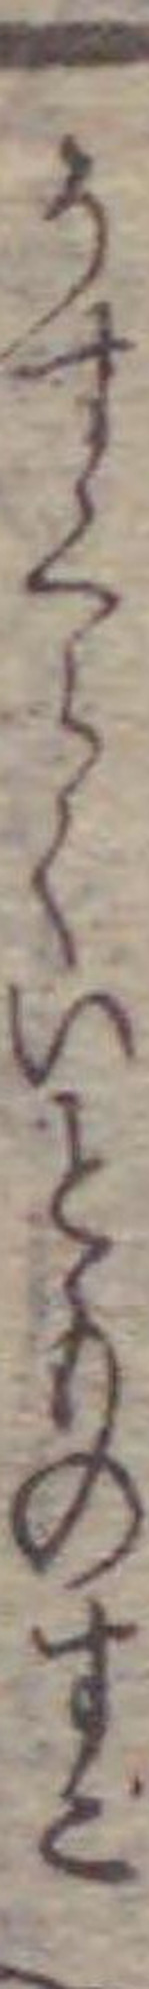うすくらくいとものすご
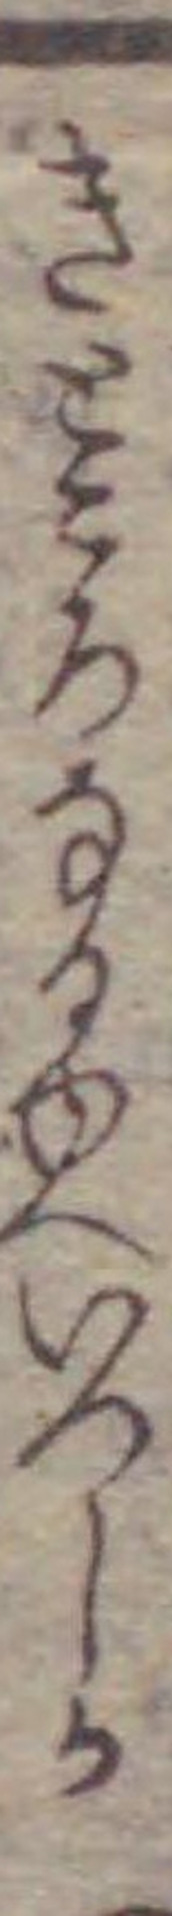きところなるゆへいつしか
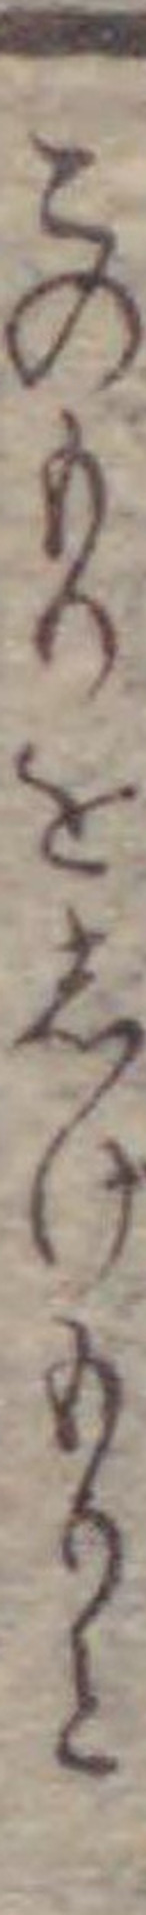このもりをしげもりと
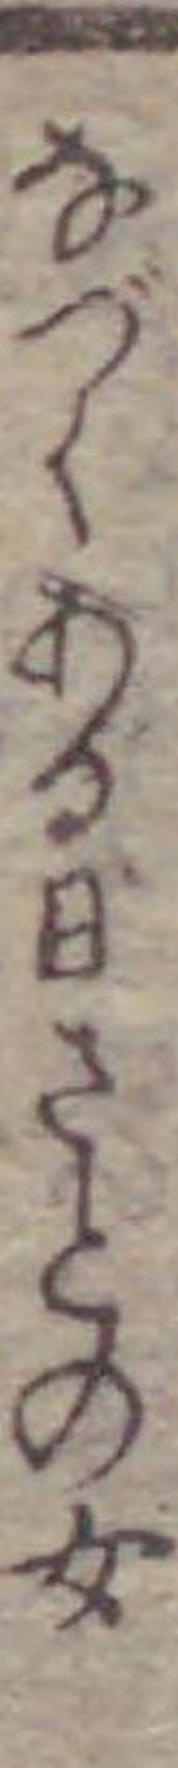なづくある日さとの女
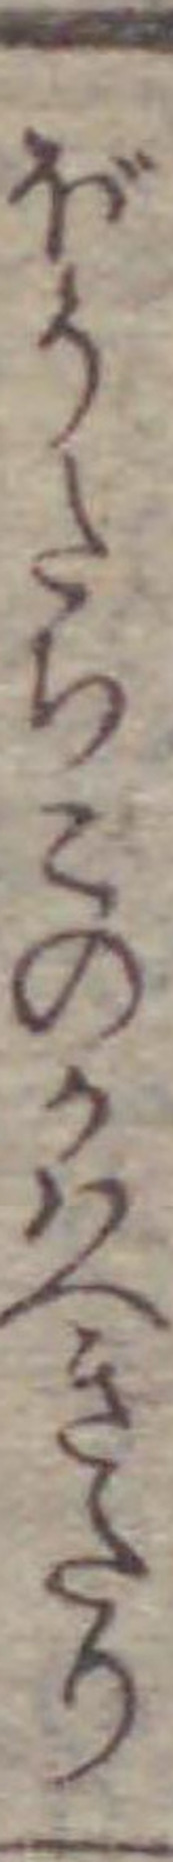ぼうたちこのかはへきたり
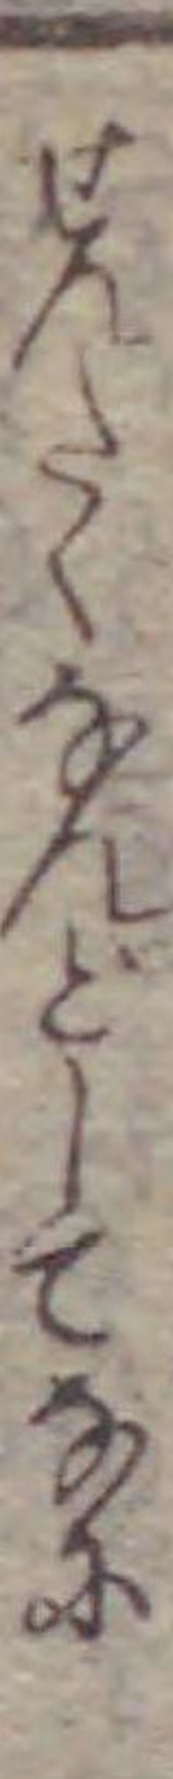せんたくなんどしてなに
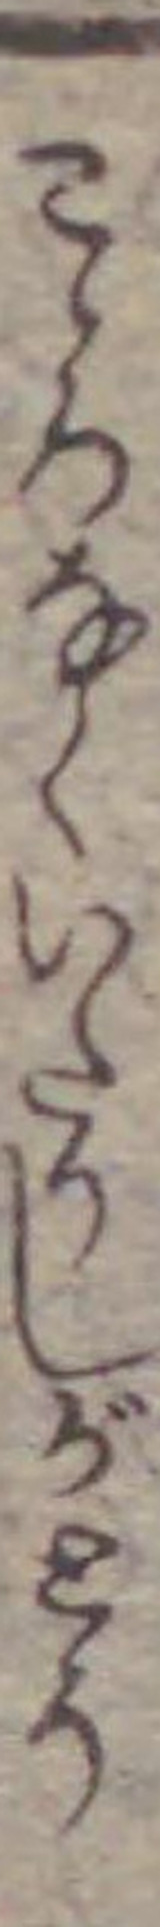こゝろなくいたりしがとう
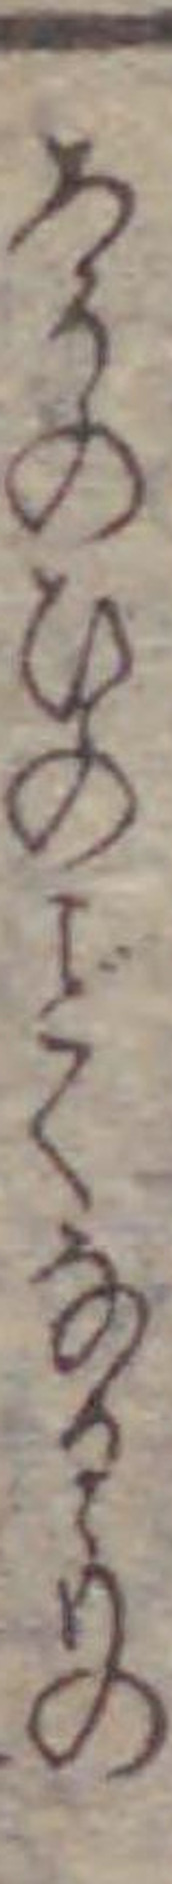ろうのひのごとくなるもの
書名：武家物奇談 : 3巻
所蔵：国立国会図書館 National Diet Library, JAPAN
